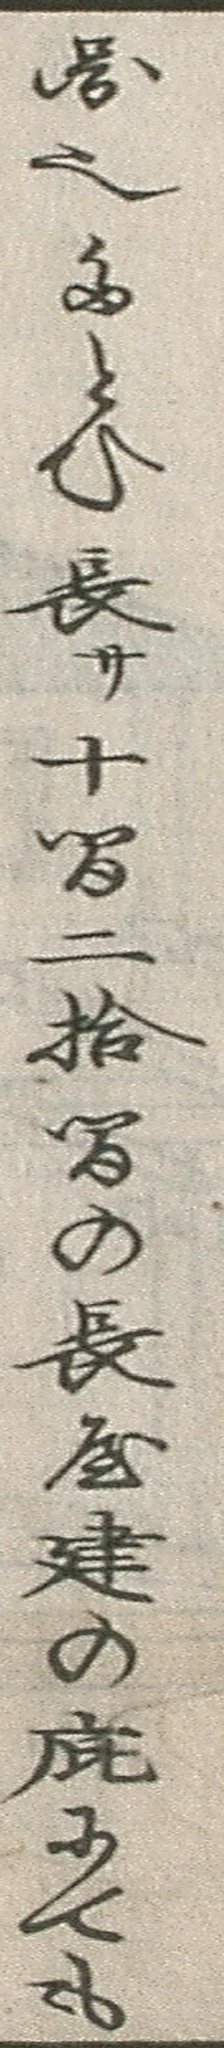図也たとひ長十間二拾間の長屋建の庇にても
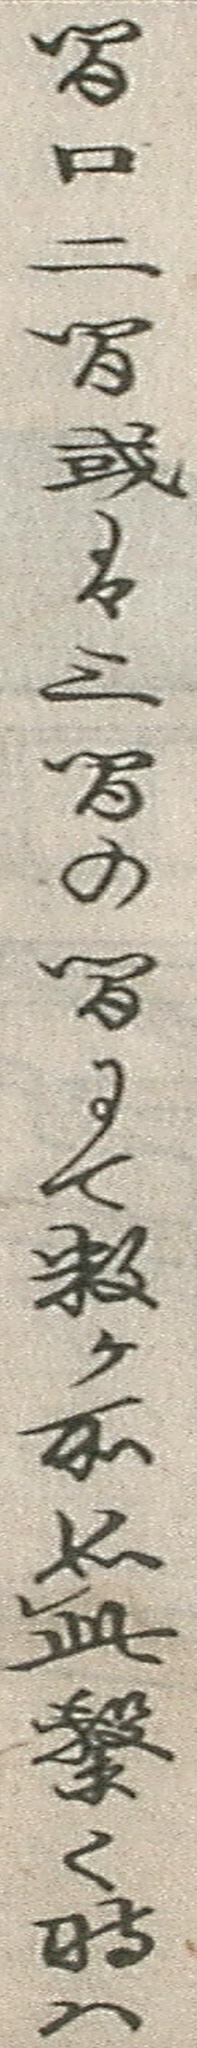間口二間或は三間の間にて数ケ所如此繋く時は
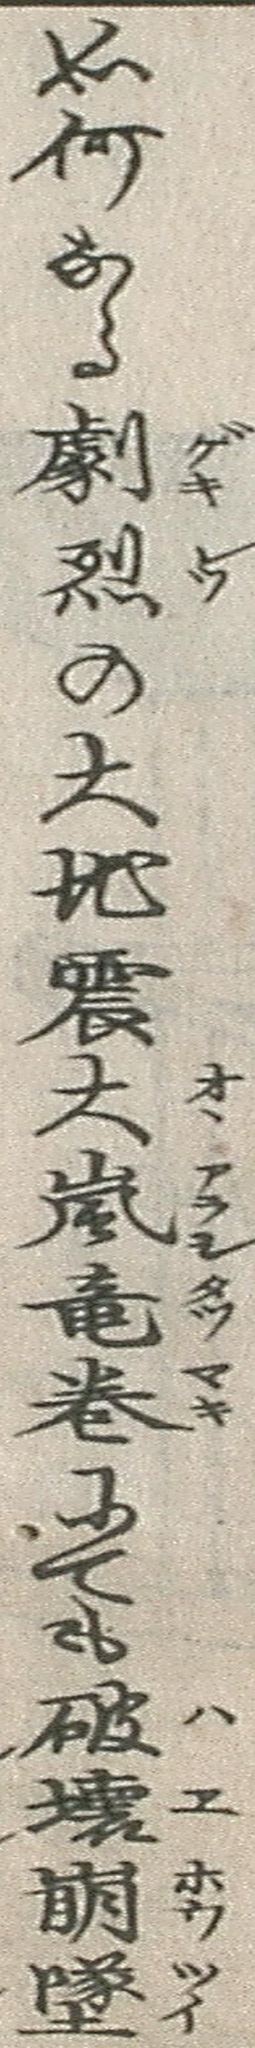如何なる劇烈の大地震大嵐竜巻にても破壊崩墜
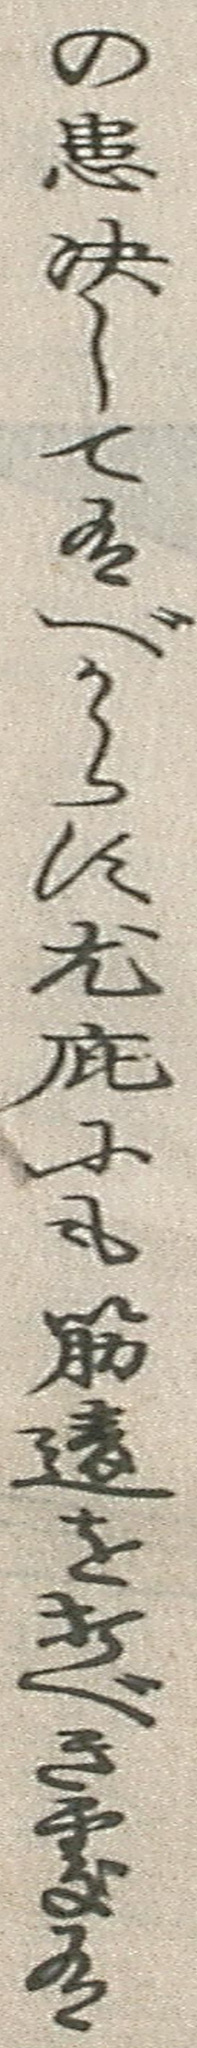の患決して有べからす尤庇にも筋違を打べき処有
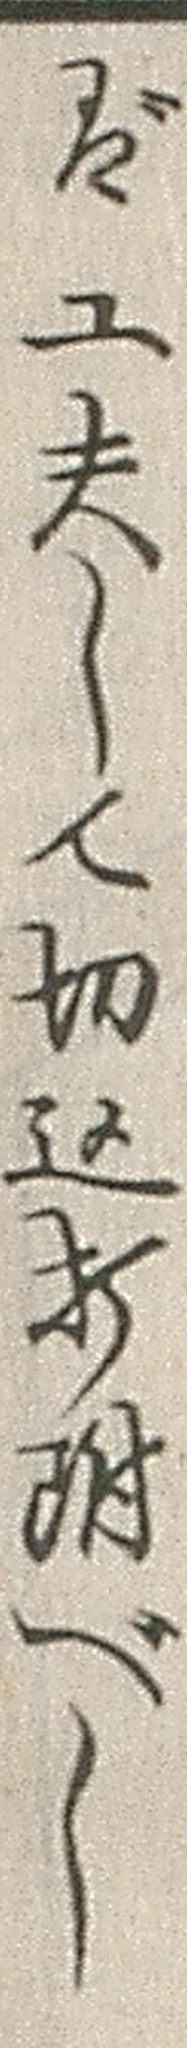ば工夫して切込打附べし
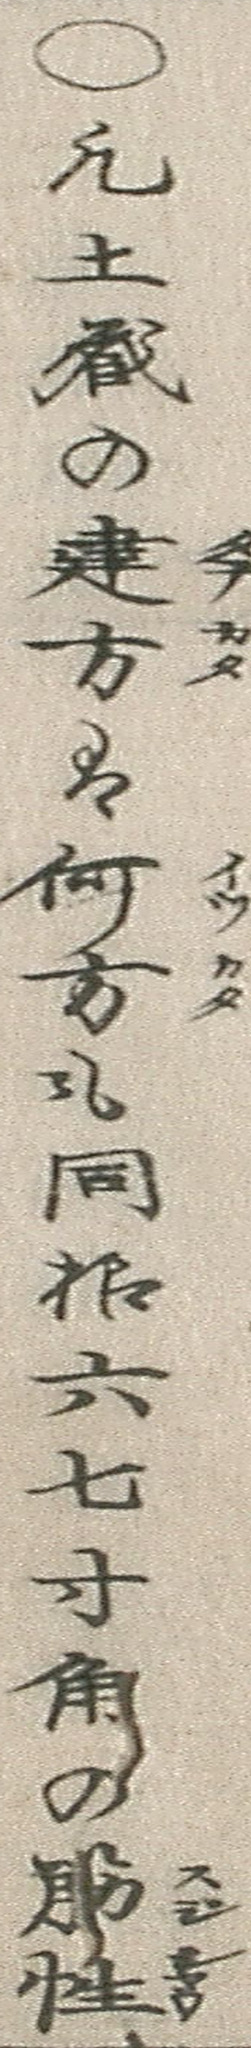〇凡土蔵の建方は何方も同様六七寸角の筋性
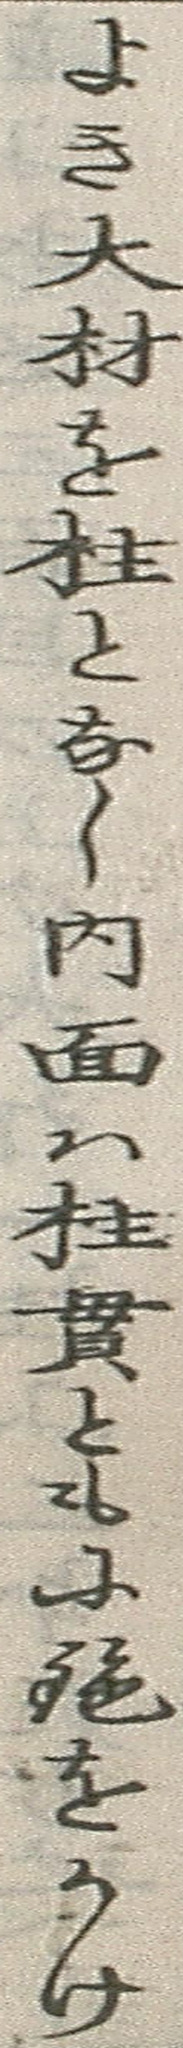よき大材を柱となし内面は柱貫ともに鉋をかけ
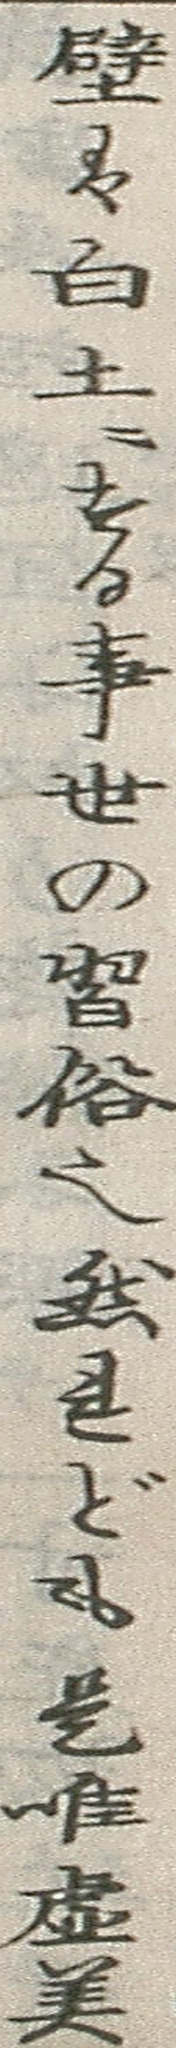壁は白土事世の習俗也然れども是唯虚美
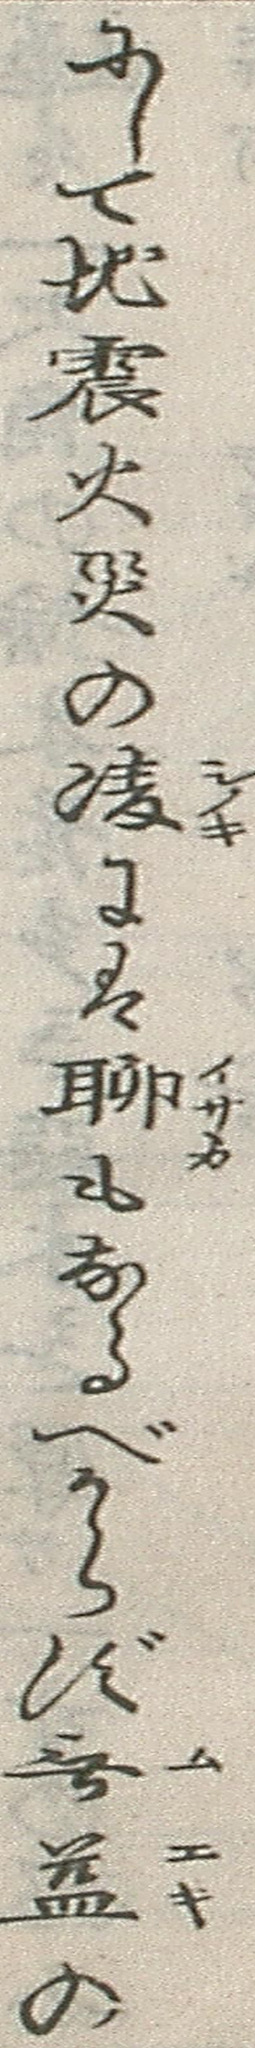にして地震火災の凌には聊もなるべからず無益の
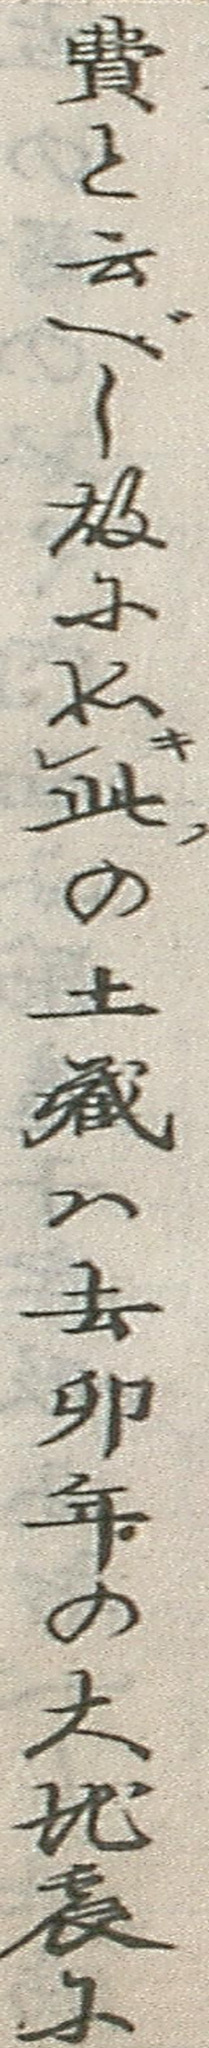費と云べし故に如此土蔵は去卯年の大地震に
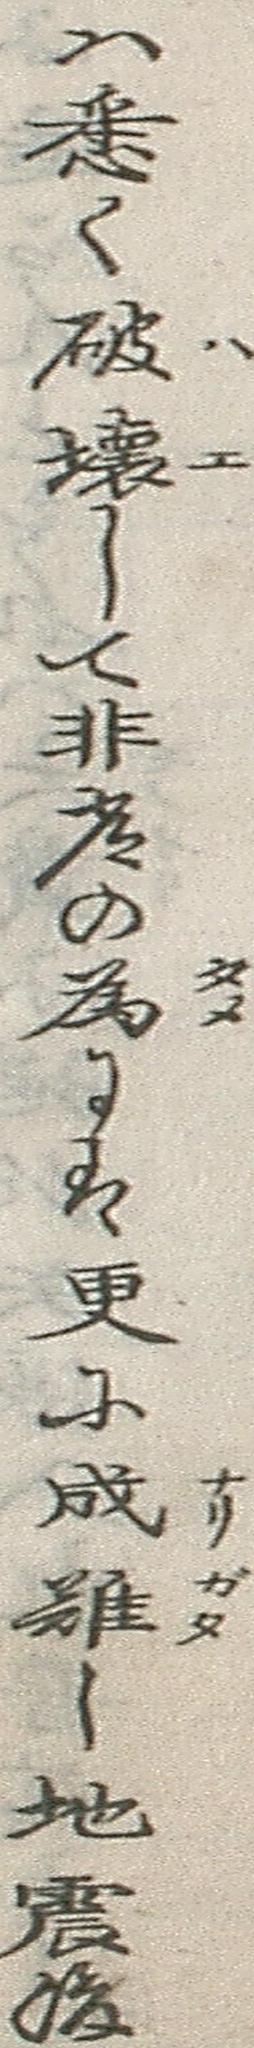は悉く破壊して非常の為には更に成難し地震後
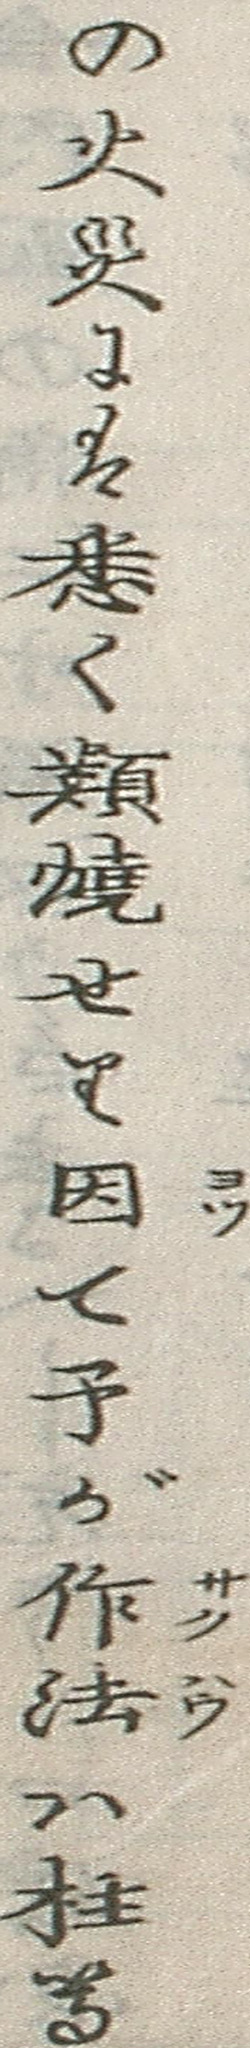の火災には悉く類焼せり因て予が作法は柱等
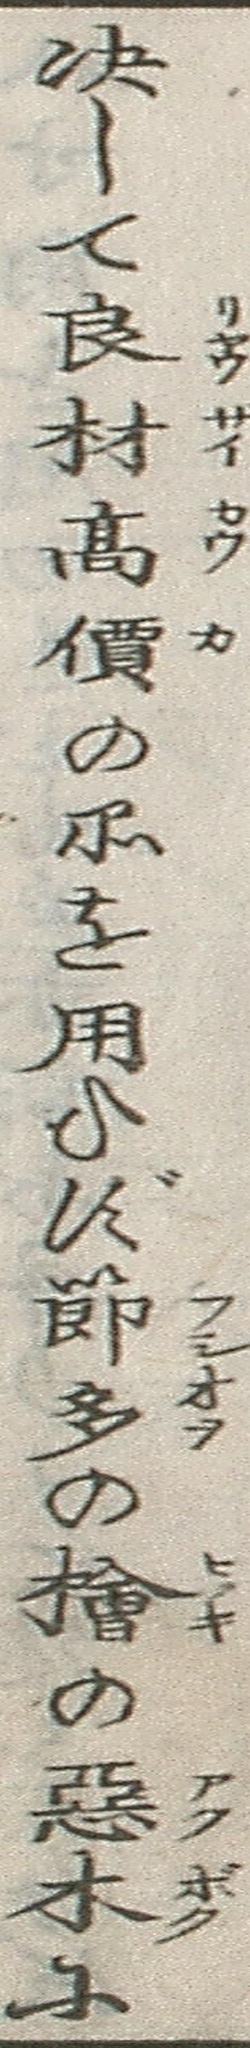決して良材高価の品を用ひず節多の檜の悪木に
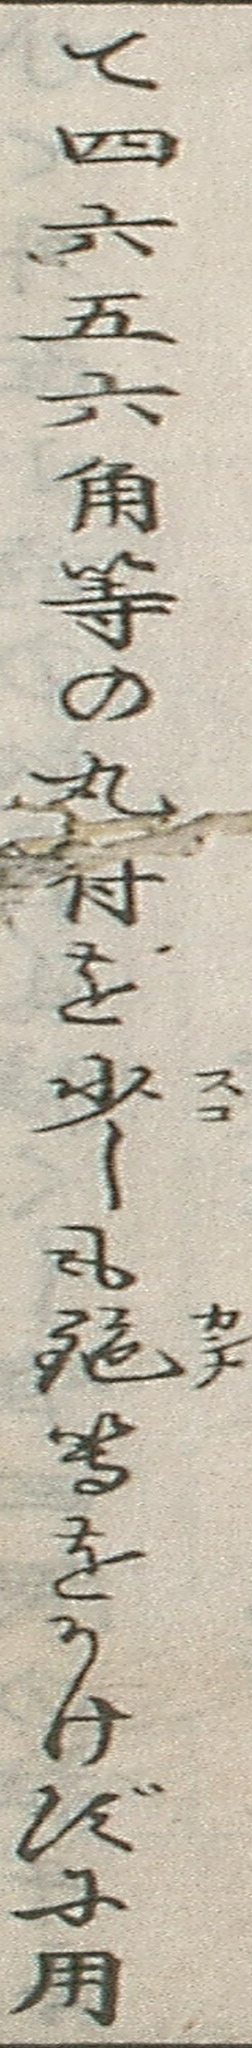て四五六七角等の丸付？を少しも鉋等をかけずに用

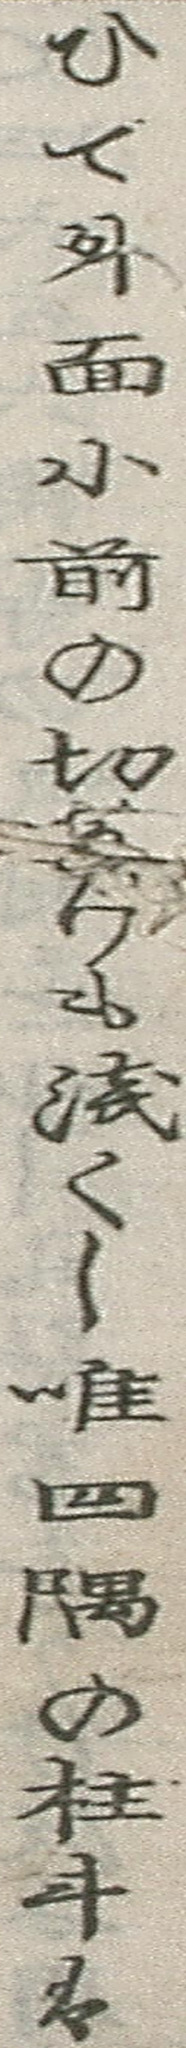ひて外面小前の切けも浅くし唯四隅の柱斗は
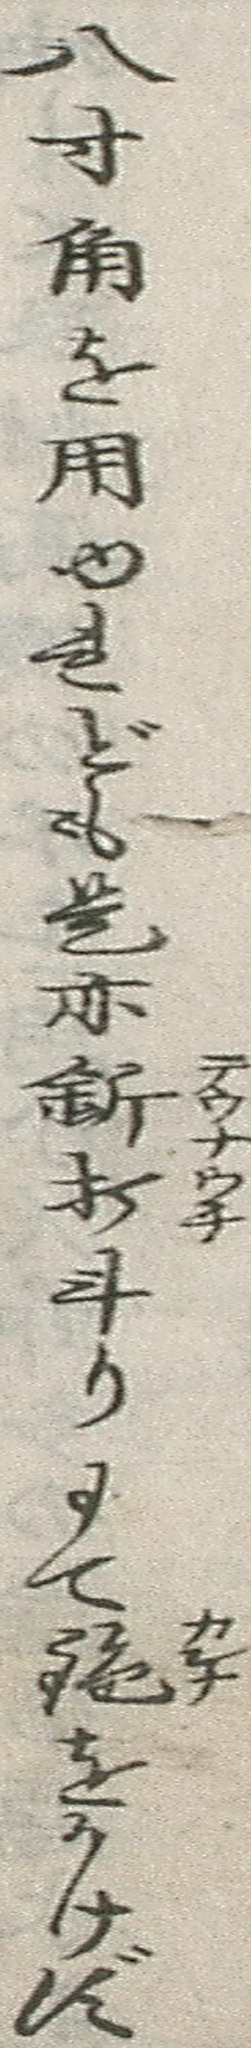八寸角を用ゆれども是亦釿打斗りにて鉋をかけず
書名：附録　地震劇風災害豫防法圖説（内題）
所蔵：東京大学地震研究所図書室 Earthquake Research Institute Library, The University of Tokyo, JAPAN
